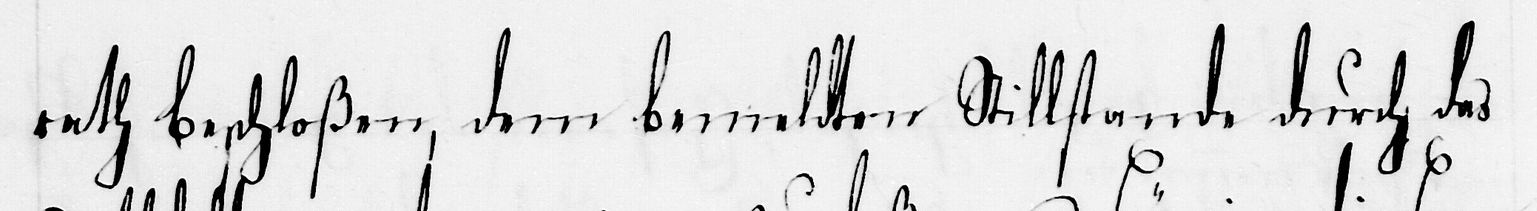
rath beschloßen, dem bemeldten Stillstande durch das
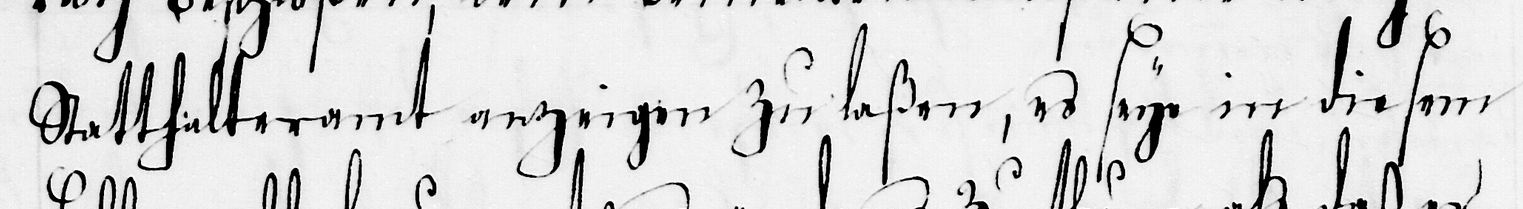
Statthalteramt anzeigen zu laßen, es seye in diesem
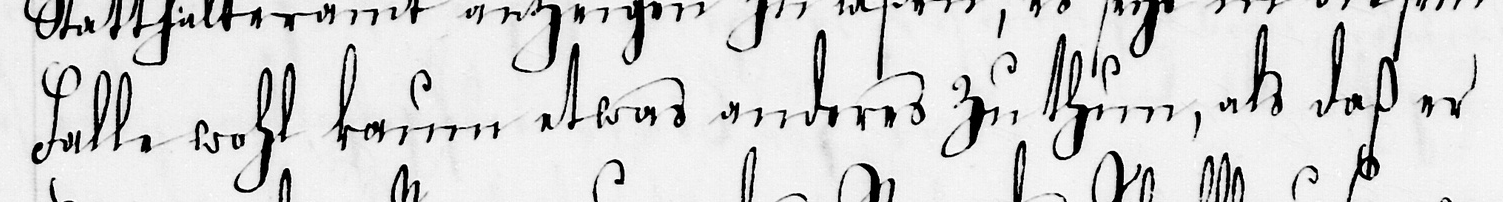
Falle wohl kaum etwas anderes zu thun, als daß er
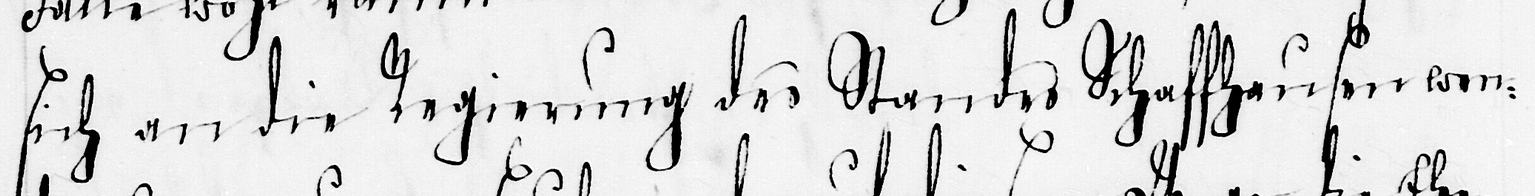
sich an die Regierung des Standes Schaffhausen wen¬
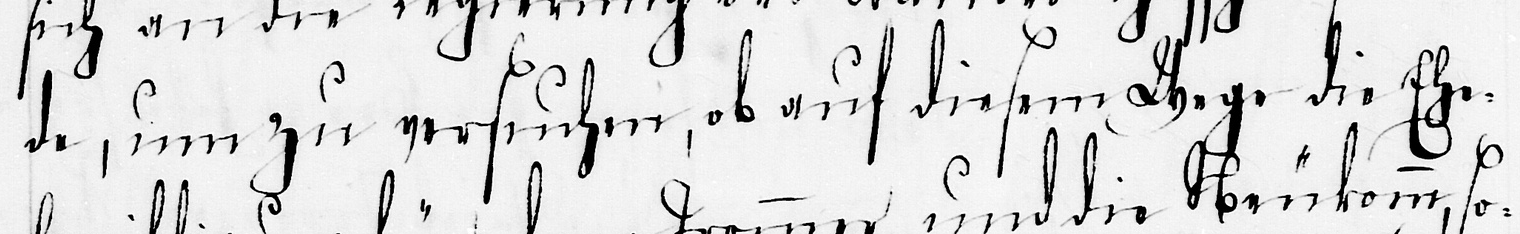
de, um zu versuchen, ob auf diesem Wege die Ehe¬
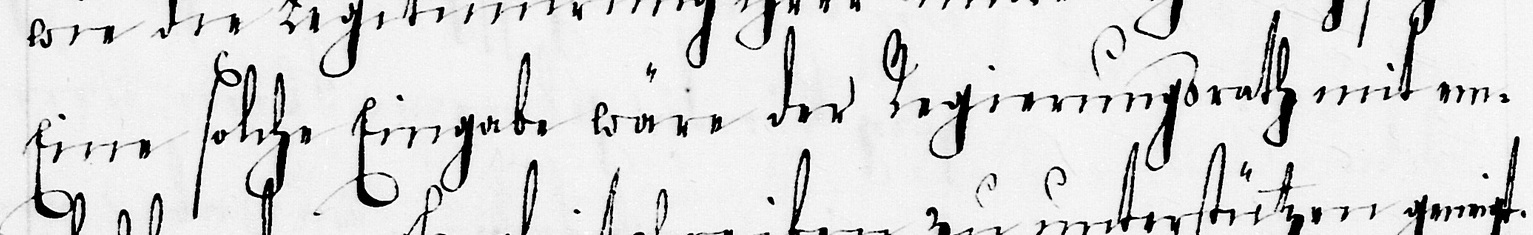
Eine solche Eingabe wäre der Regierungsrath mit em¬
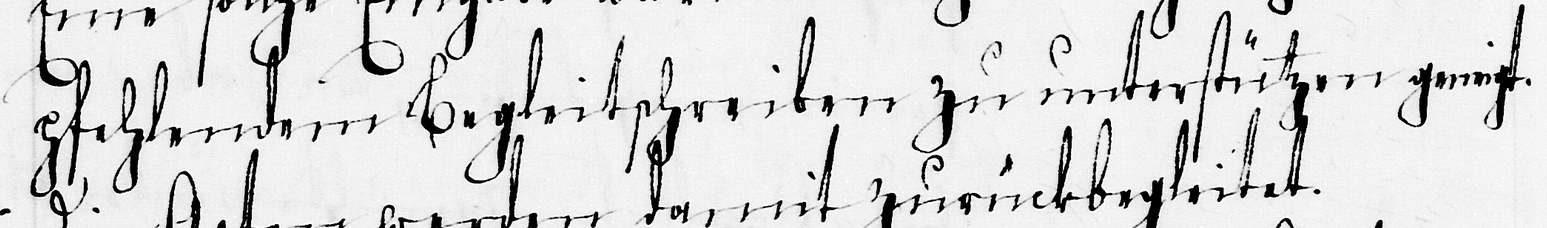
pfehlendem Begleitschreiben zu unterstützen gene¬
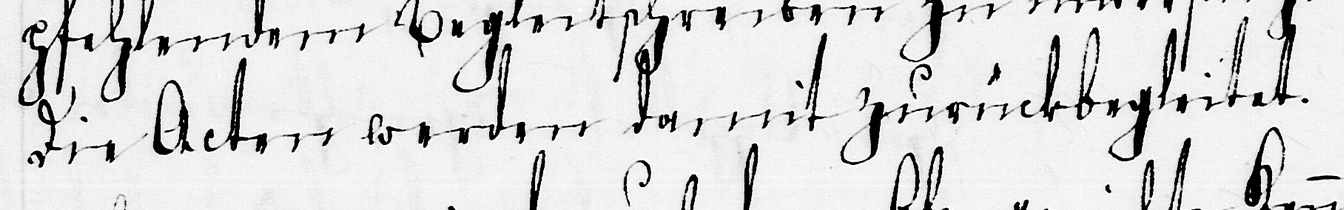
Die Acten werden damit zurückbegleitet.
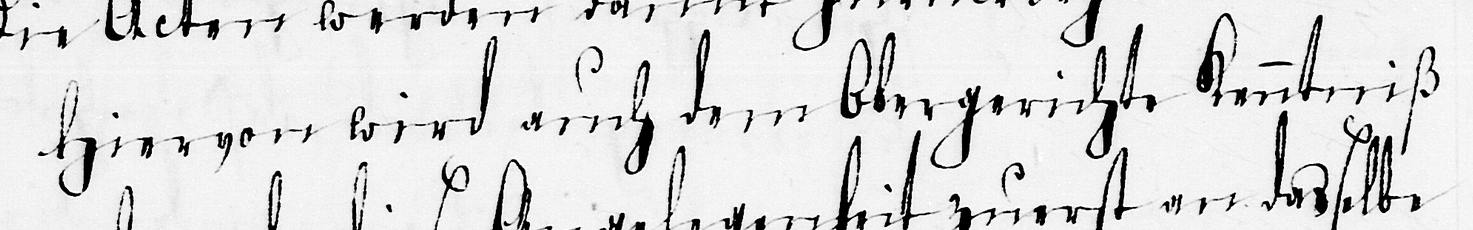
Hiervon wird auch dem Obergerichte Kenntniß
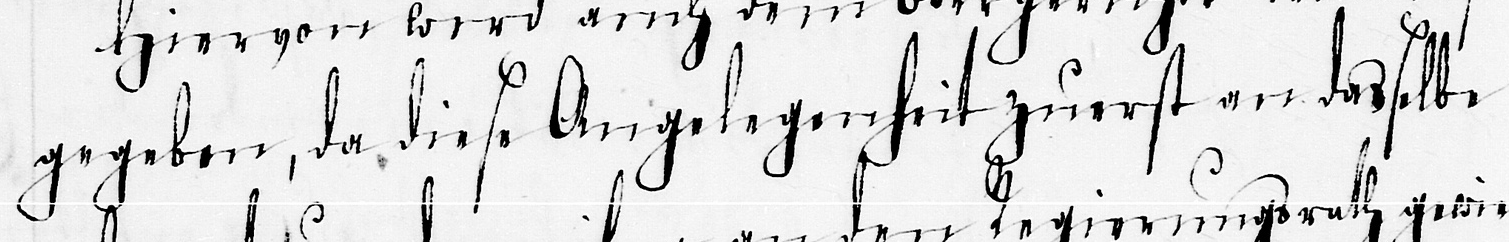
gegeben, da diese Angelegenheit zuerst an dasselbe
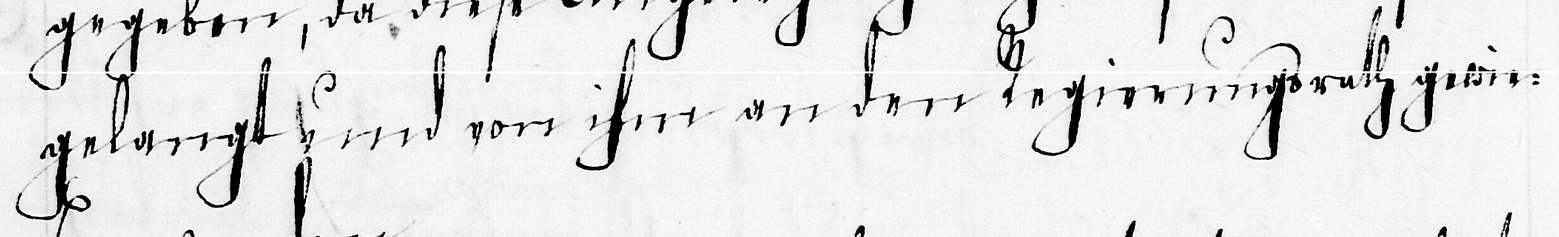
gelangt und von ihm an den Regierungsrath gewie¬
